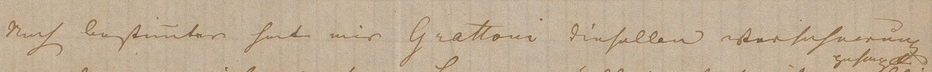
Noch bestimmter hat mir Grattoni dieselbe Versicherung
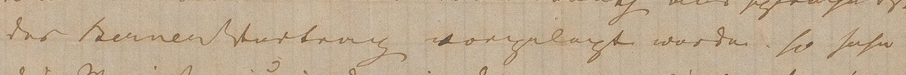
der Berner Vertrag vorgelegt werde – so sehe
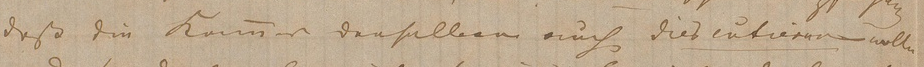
daß die Kammer denselben auch discutiren wolle
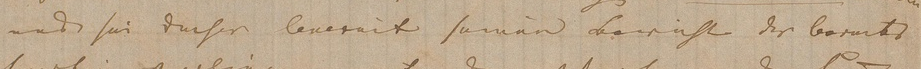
und sei daher bereit seinen Bericht der bereits
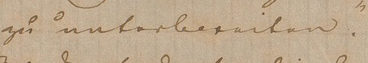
zu unterbreiten».
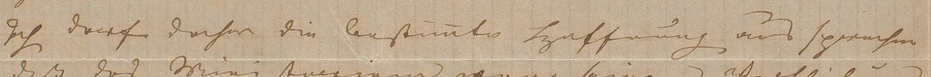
Ich darf daher die bestimmte Hoffnung aussprechen
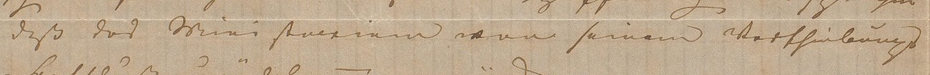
daß das Ministerium von seinem Verschiebungs-
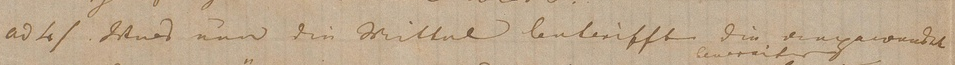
ad 4) Was nun die Mittel betrifft die angewendet
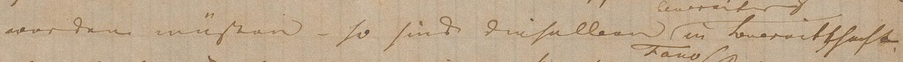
werden müßen – so sind dieselben bereits in Bereitschaft.
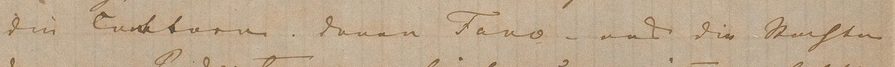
die Centern denen Fano – und die Rechte
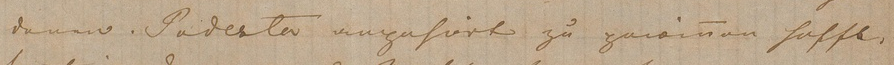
denen – Podesta angehört zu gewinnen hofft,
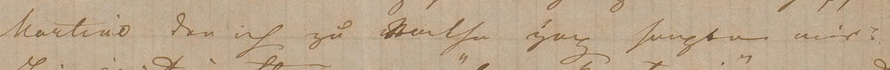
Martino den ich zu Rathe zog sagte mir:
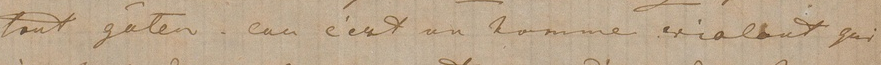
tout gâter – car c'est un homme violent qui
